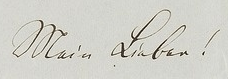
Mein Lieber!
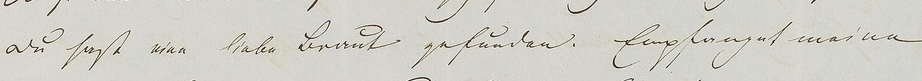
Du hast eine liebe Braut gefunden. Empfanget meine
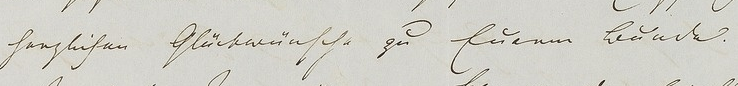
herzlichen Glückwünsche zu Euerm Bunde.
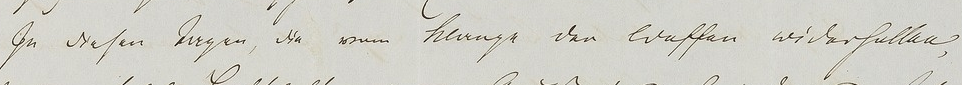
In diesen Tagen, die vom Klange der Waffen widerhallen,
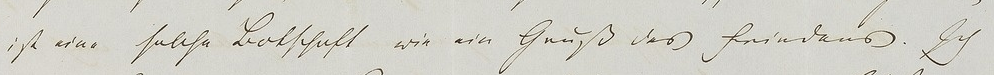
ist eine solche Botschaft wie ein Gruß des Friedens. Ich
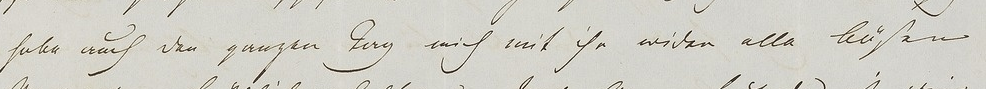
habe auch den ganzen Tag mich mit ihr wider alle bösen
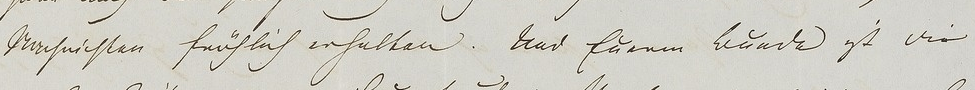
Nachrichten fröhlich erhalten. Und Euerm Bunde ist die
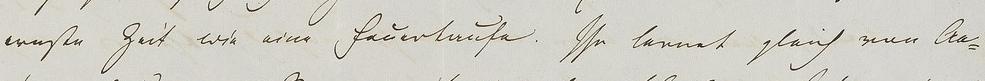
ernste Zeit wie eine Feuertaufe. Ihr lernet gleich von An-
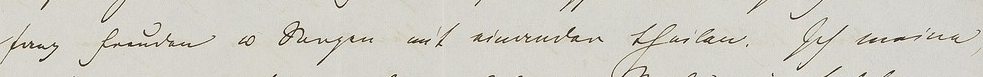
fang Freuden & Sorgen mit einander theilen. Ich meine,
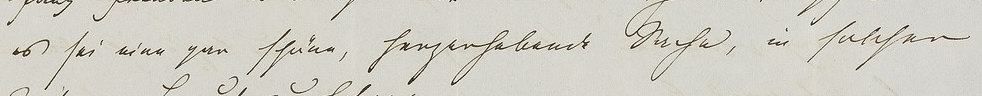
es sei eine gar schöne, herzerhebende Sache, in solcher
